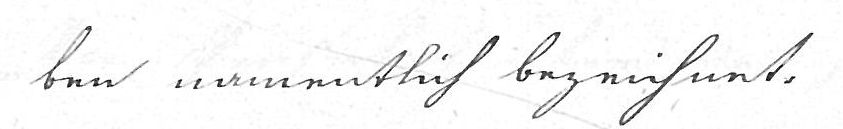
ben namentlich bezeichnet.
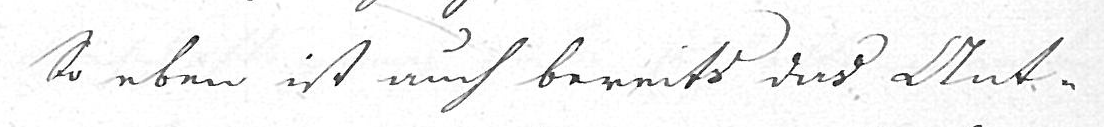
So eben ist auch bereits das Ant-
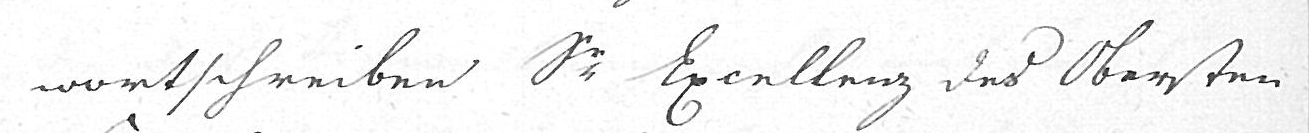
wortschreiben Sr. Excellenz des Obersten
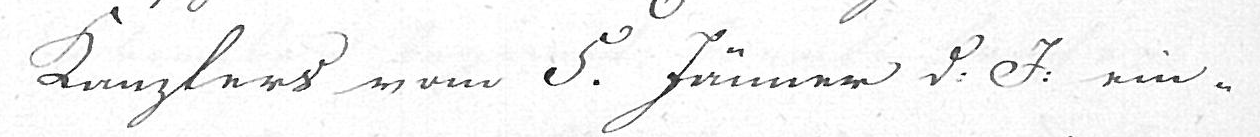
Kanzlers vom 5. Jänner d. J. ein-
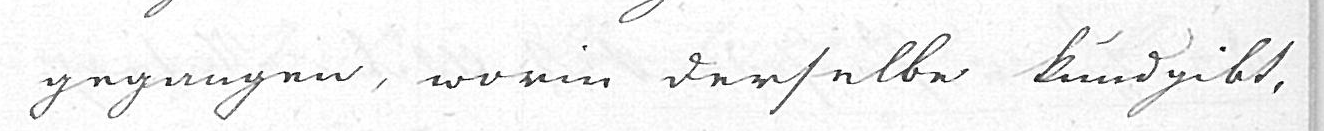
gegangen, worin derselbe kundgibt,
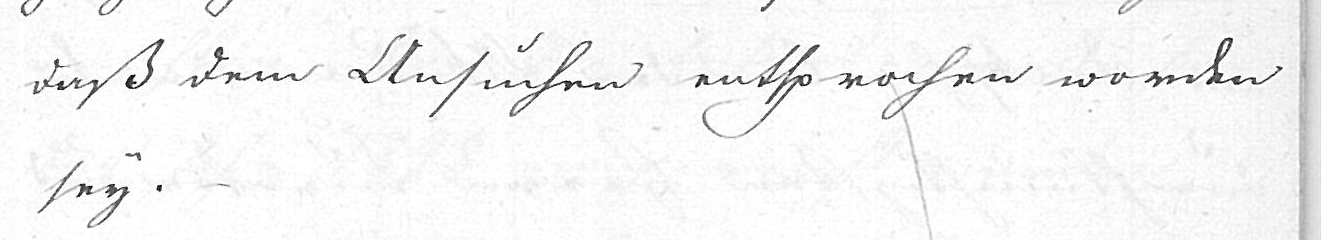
daß dem Ansuchen ensprochen worden.
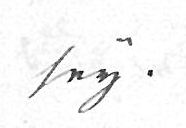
sey.
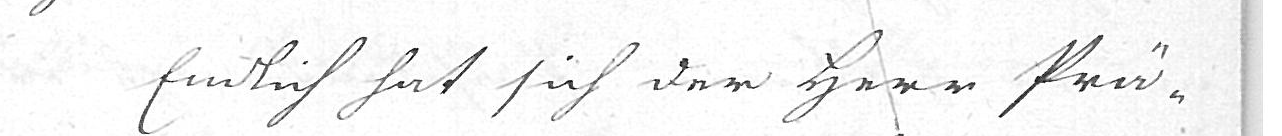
Endlich hat sich der Herr Prä-
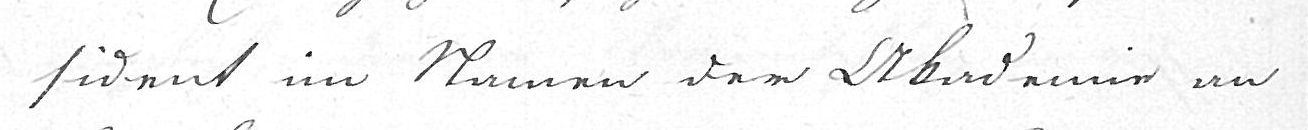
sident im Namen der Akademie an
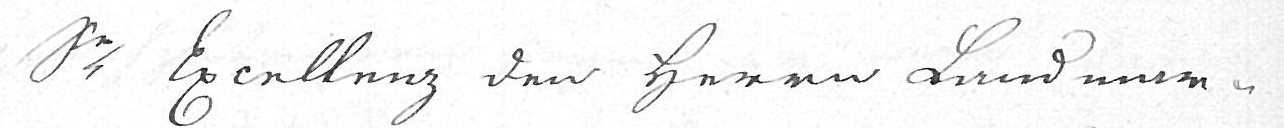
Sr. Excellent den Herrn Landmar-
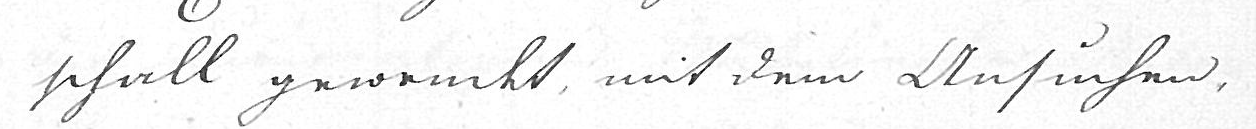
schall gewendet, mit dem Ansuchen,
